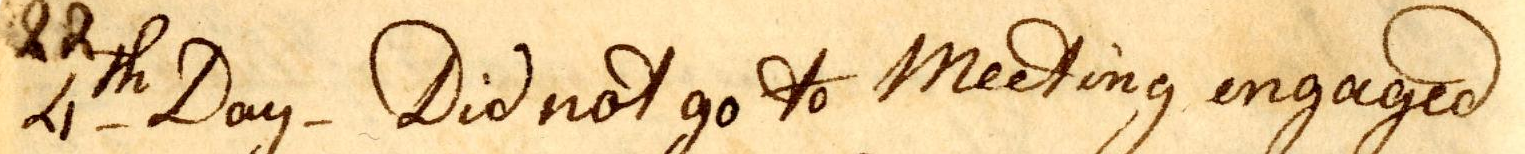4^th Day- Did not go to Meeting engaged
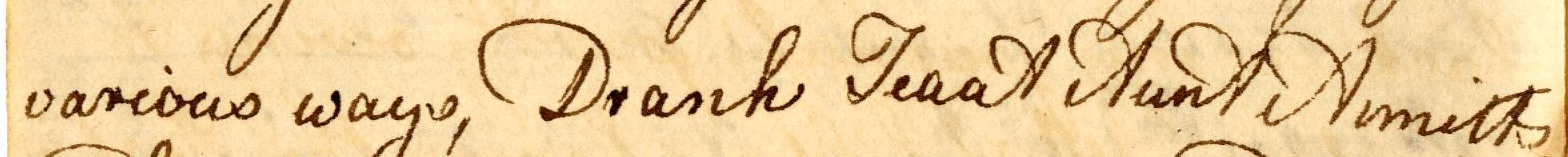various ways, Drank Tea at Aunt Armitts
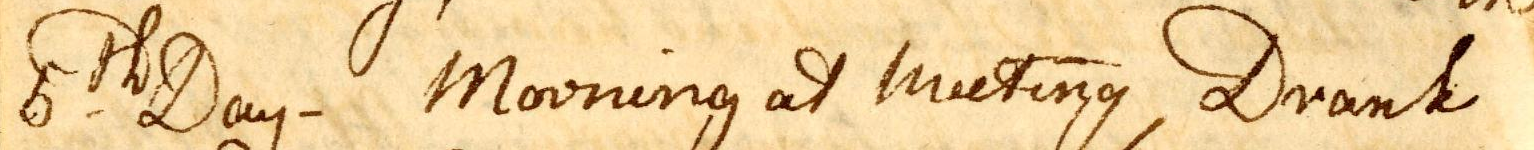5^th Day- Morning at Meeting, Drank
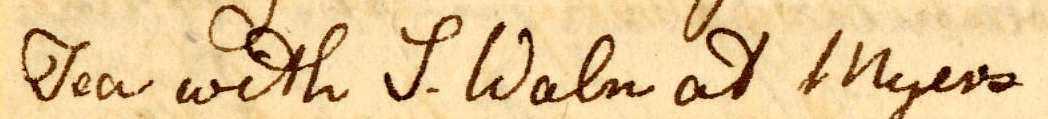Tea with S. Waln at Myers
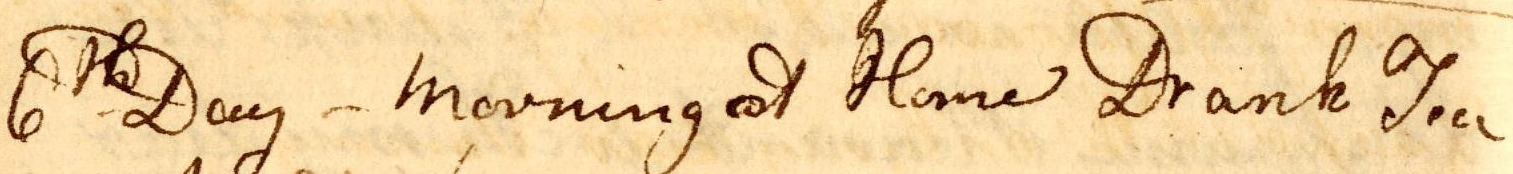6^th Day- morning at Home Drank Tea
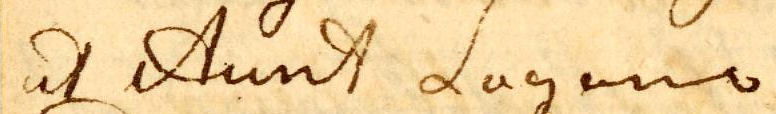at Aunt Logans
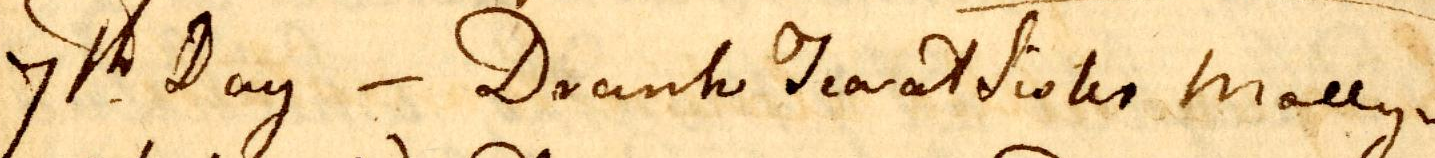7^th Day- Drank Tea at Sister Mollys
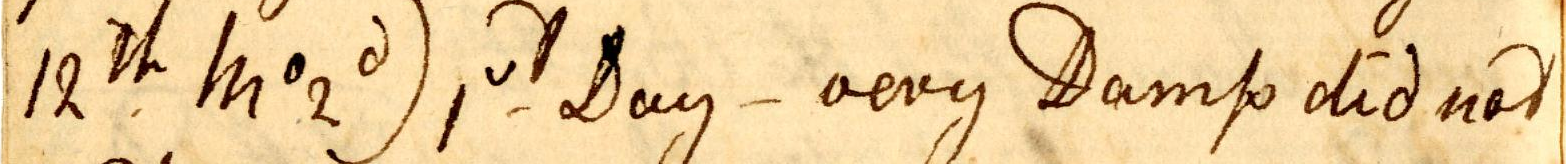12^th M^o 2^d) 1^st Day- very Damp did not
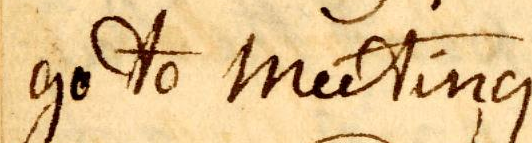go to meeing
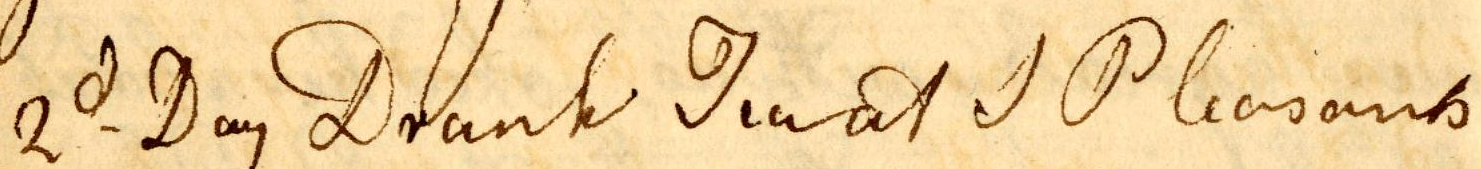2^d. Day Drank Tea at S Pleasants
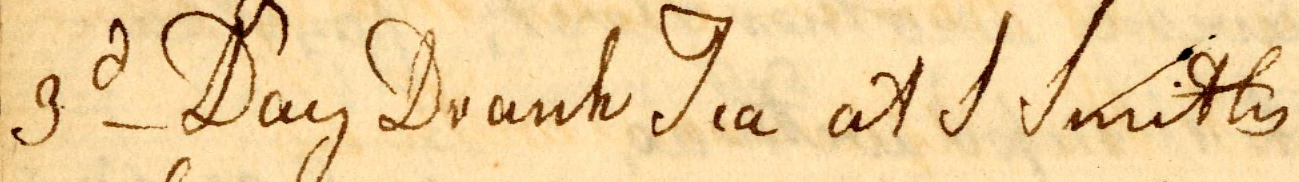3^d- Day Drank Tea at S Smiths
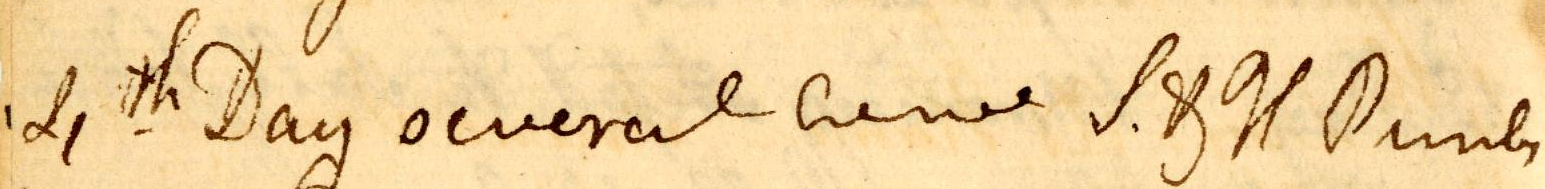4^th Day several came S. & H Pemb,
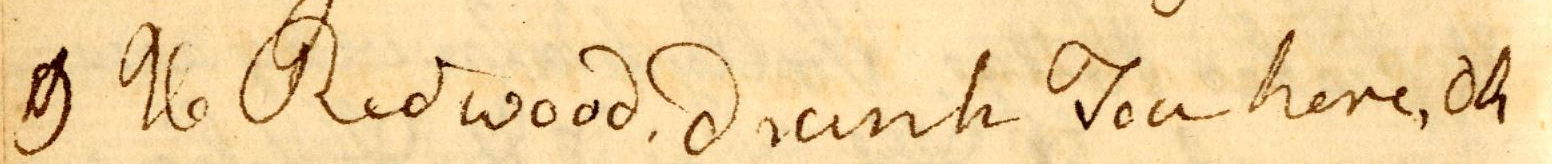& H Redwood drank Tea here, Oh
